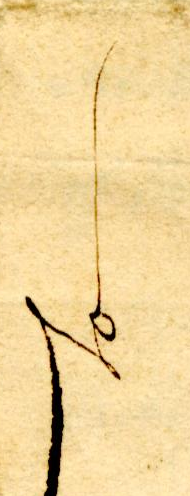To
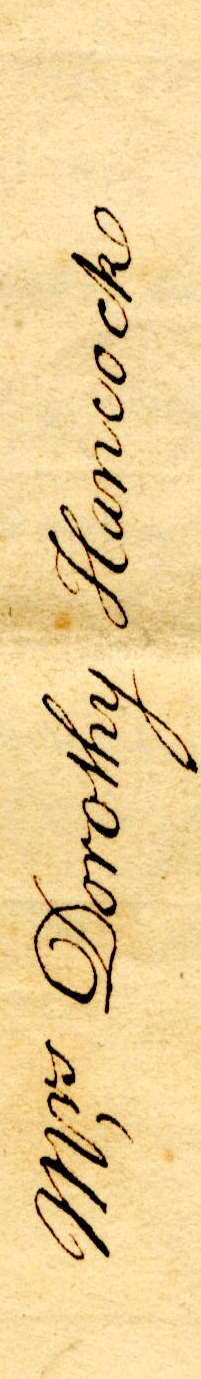M,^rs Dorothy Hancock
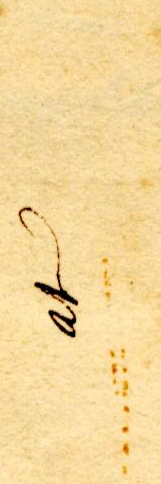at
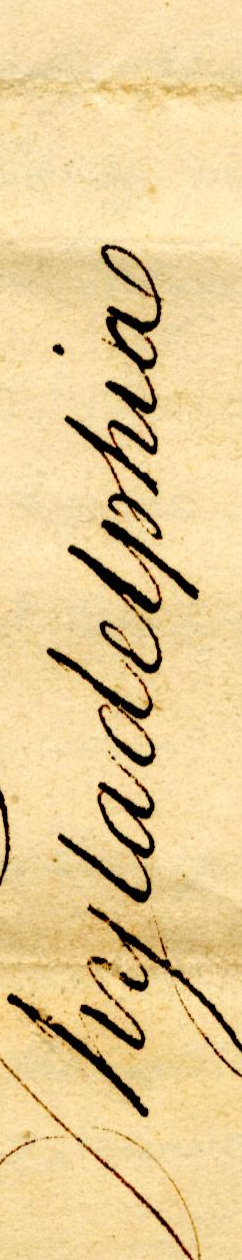Phyladelphia
